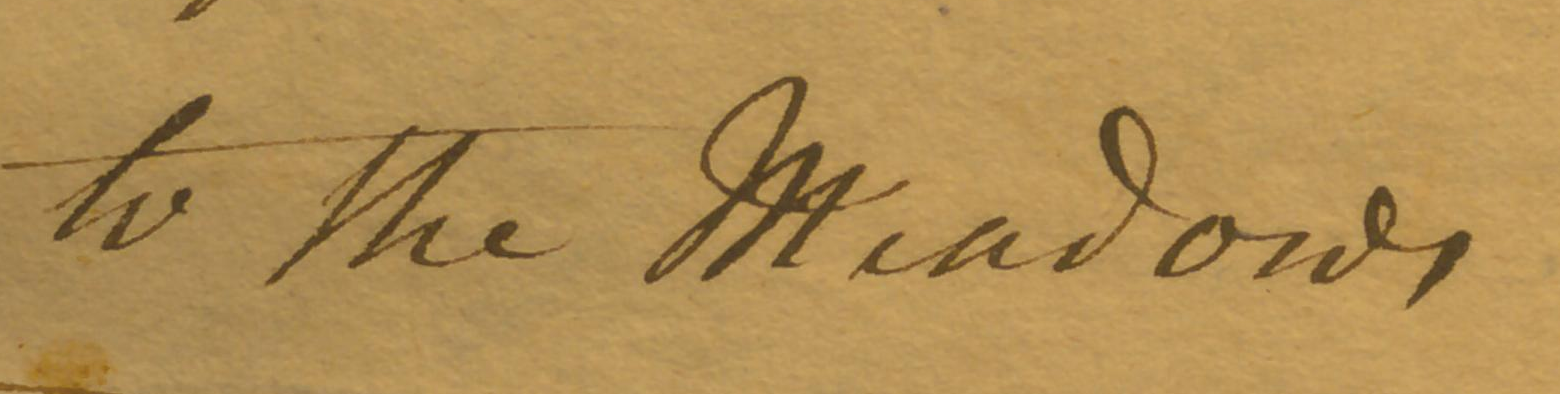to the Meadows
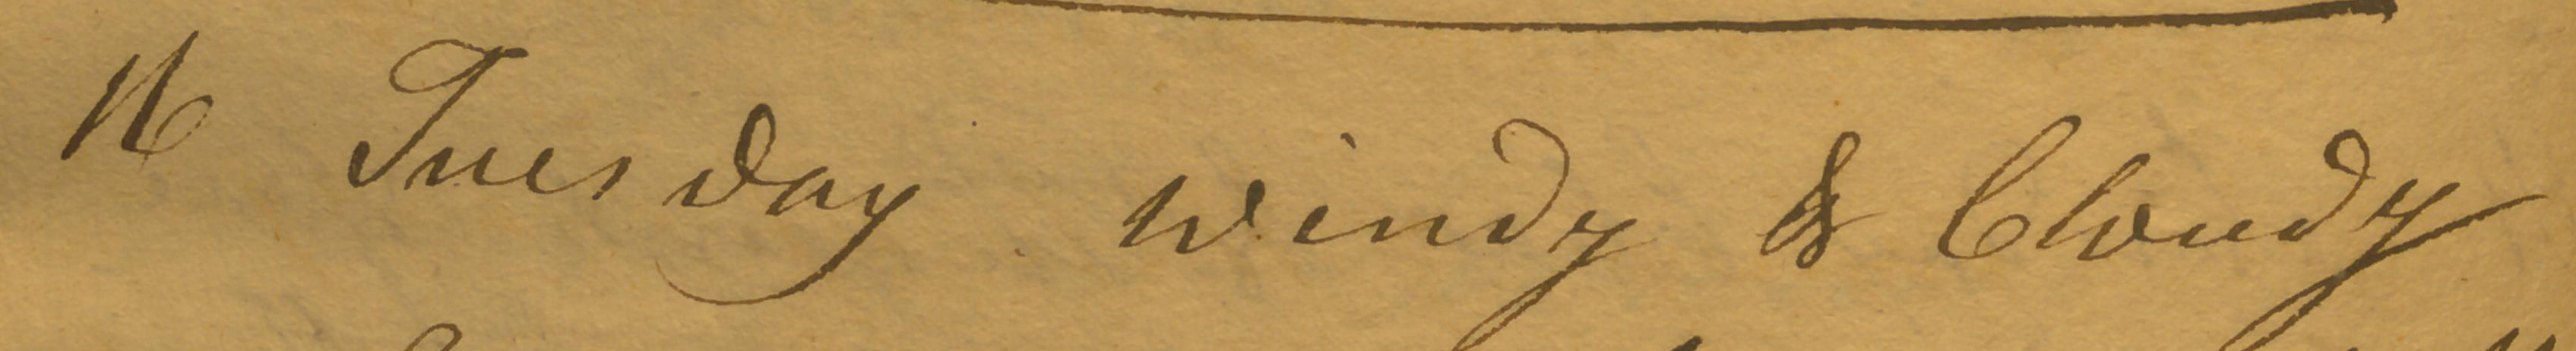16 Tuesday windy & Cloudy
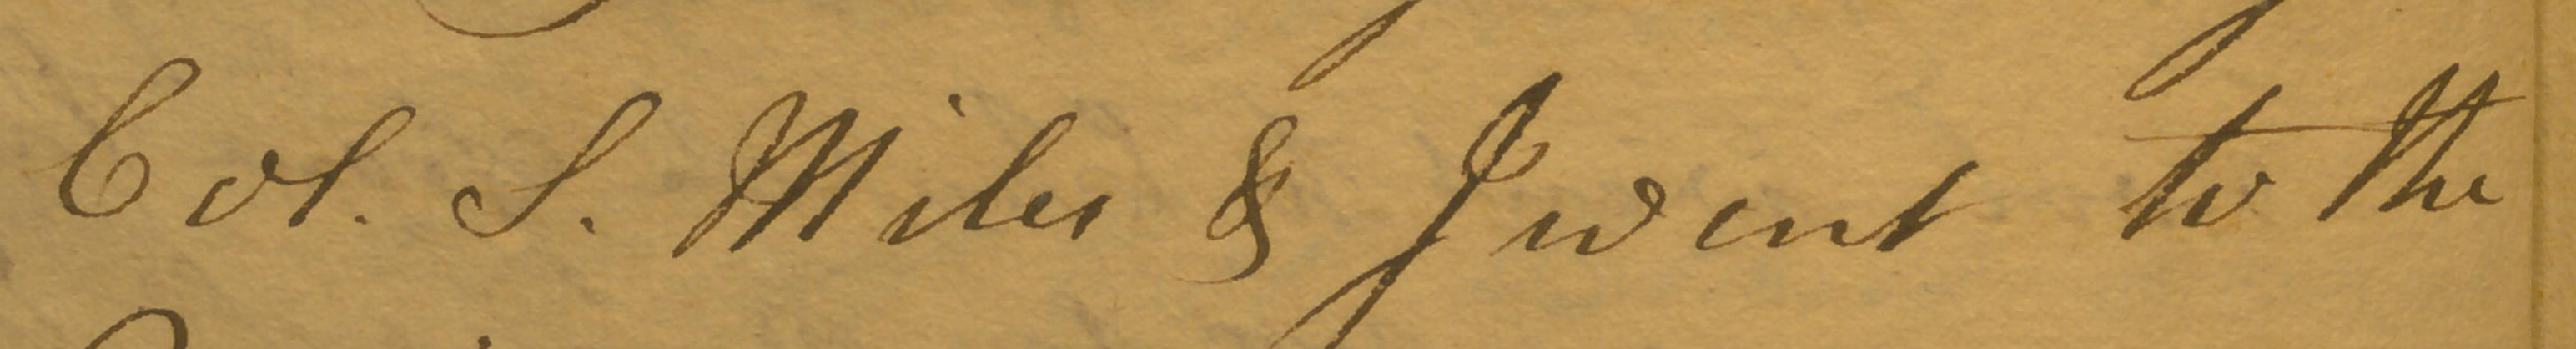Col. S. Miles & I went to the
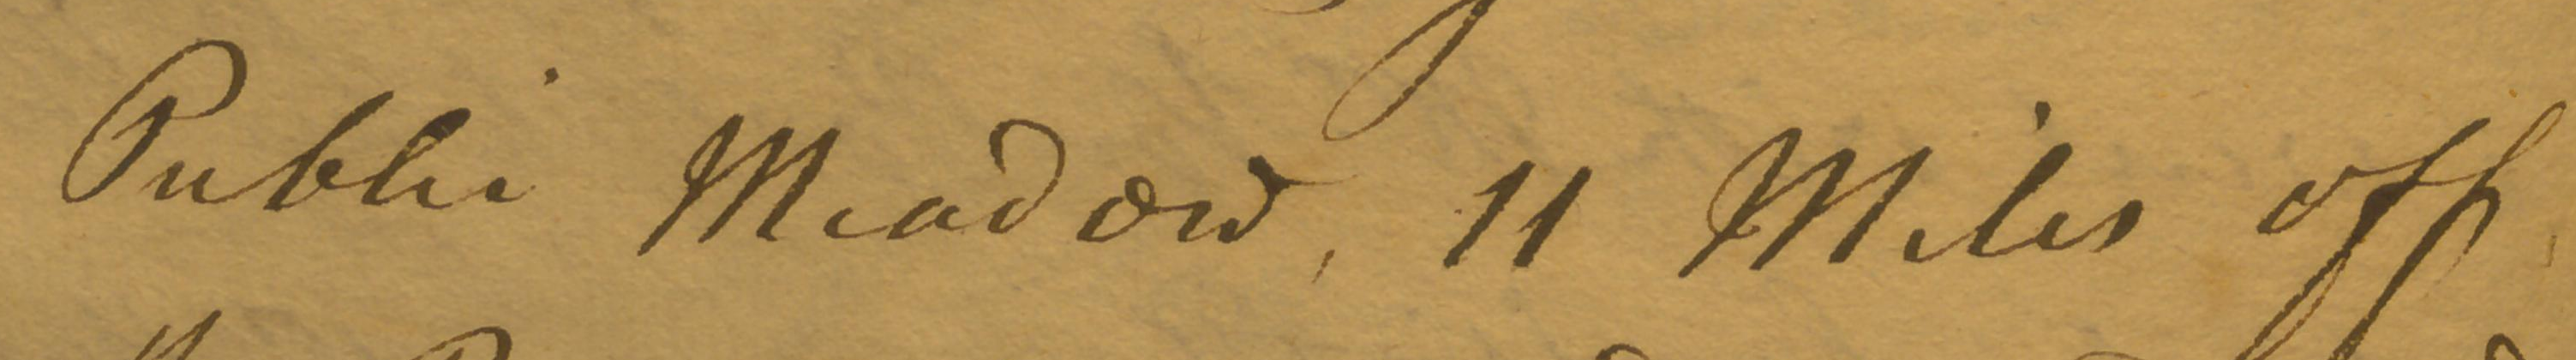Public Meadow, 11 Miles off
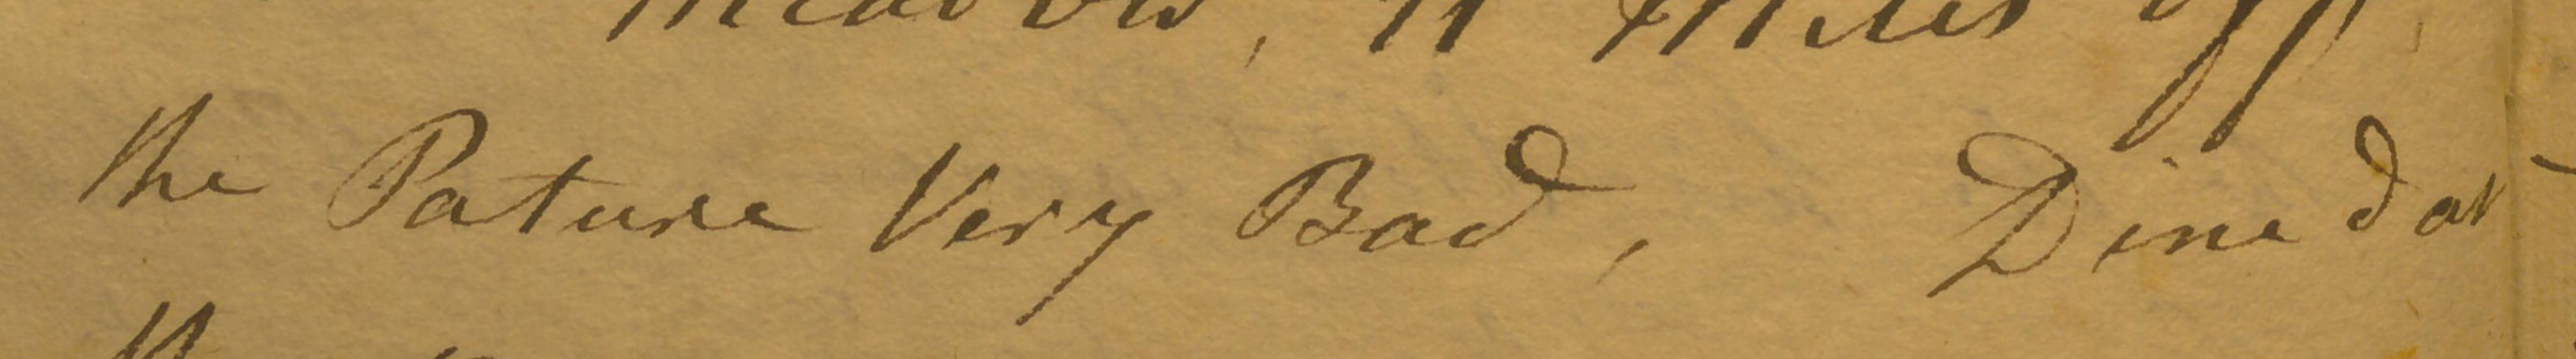the Pature Very Bad, Dine'd at
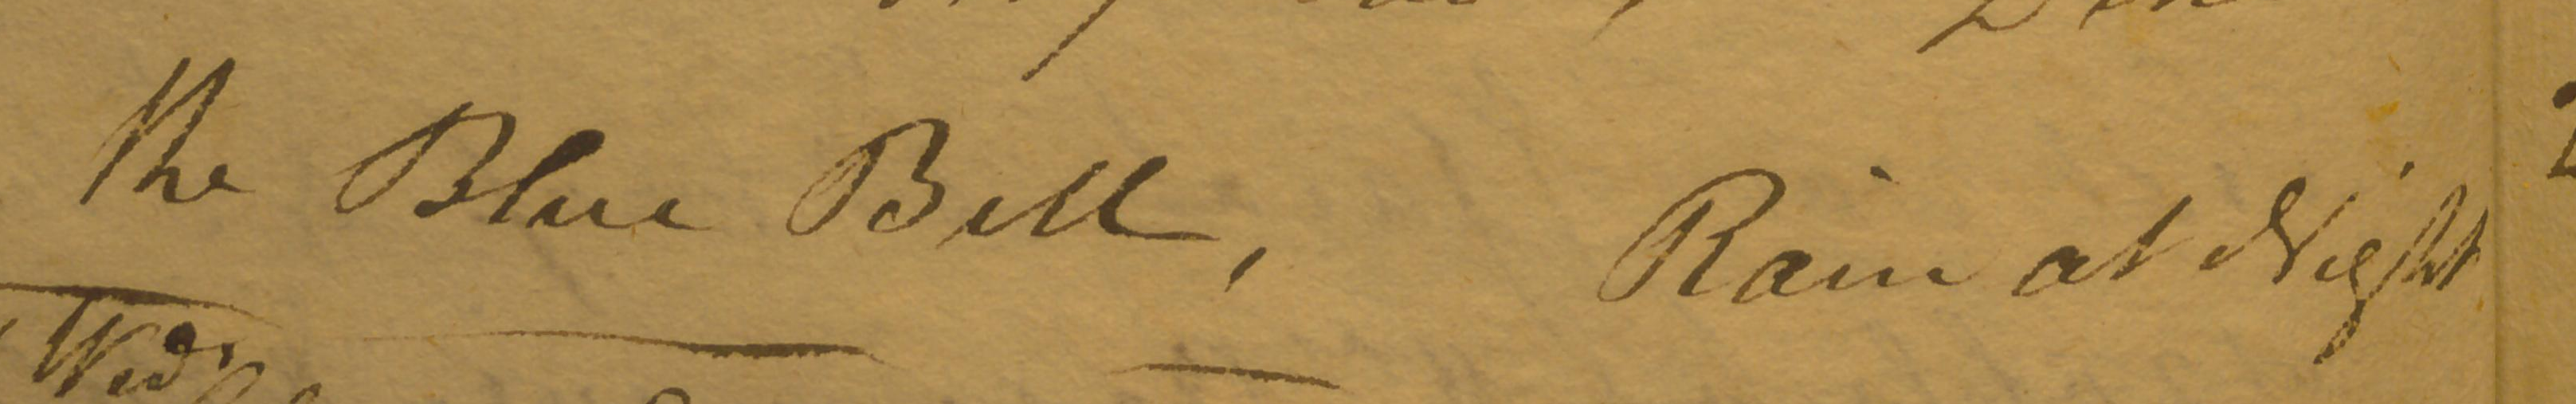the Bluce Bell, Rain at Night
